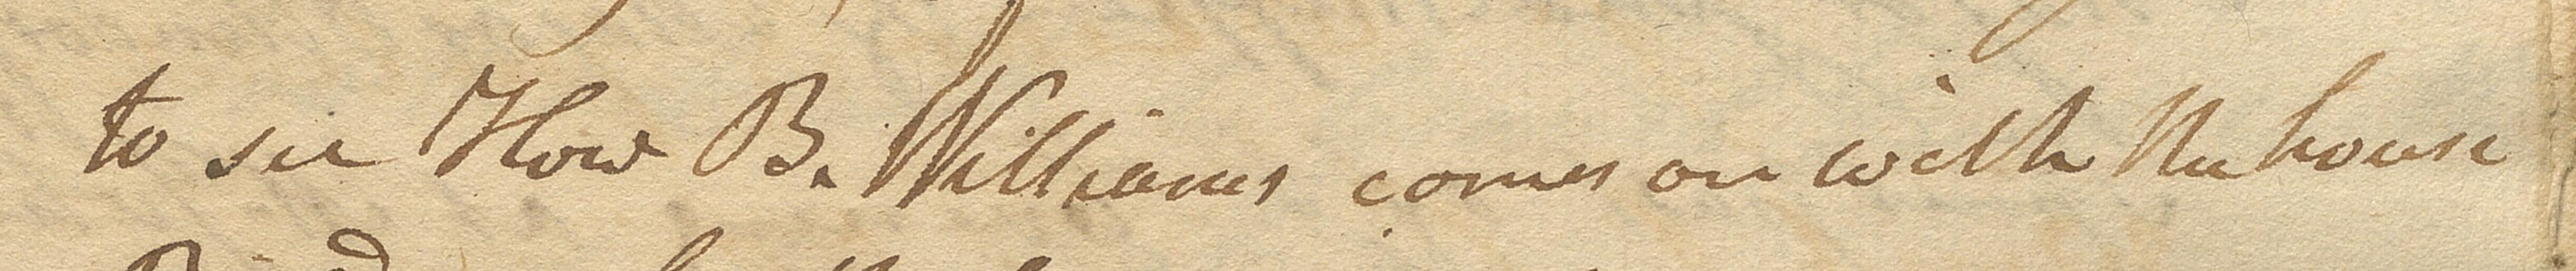to see How B. Williams comes on with the house
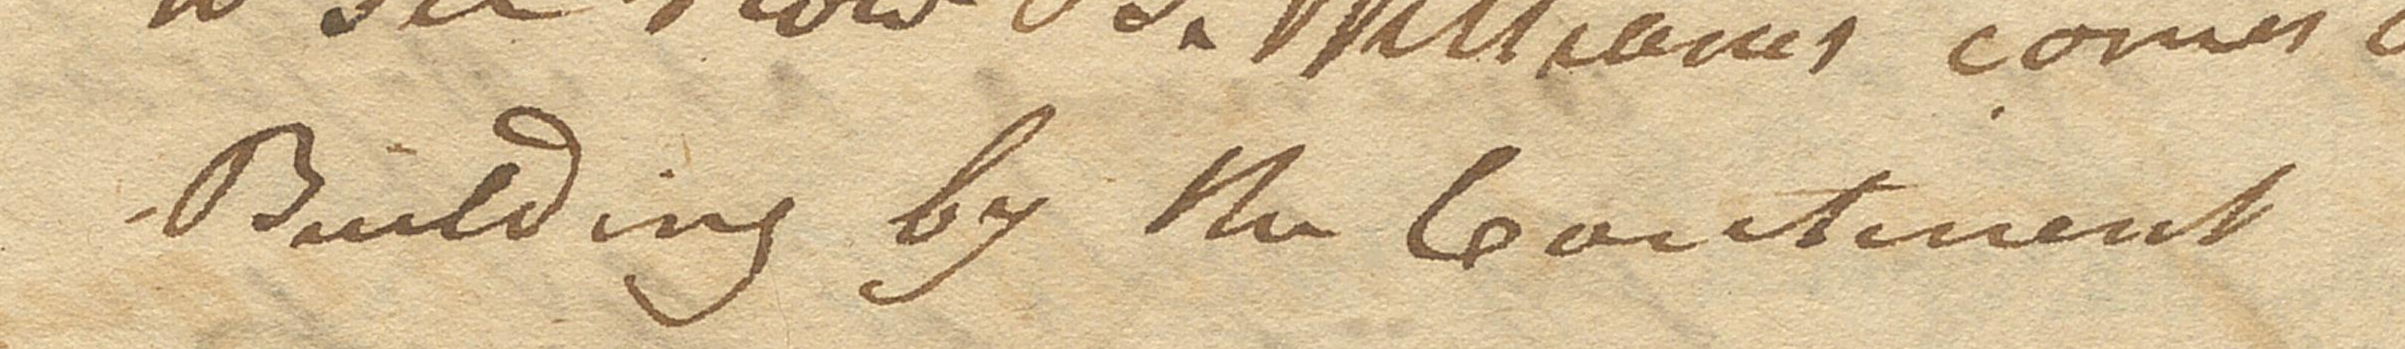Building by the Continent
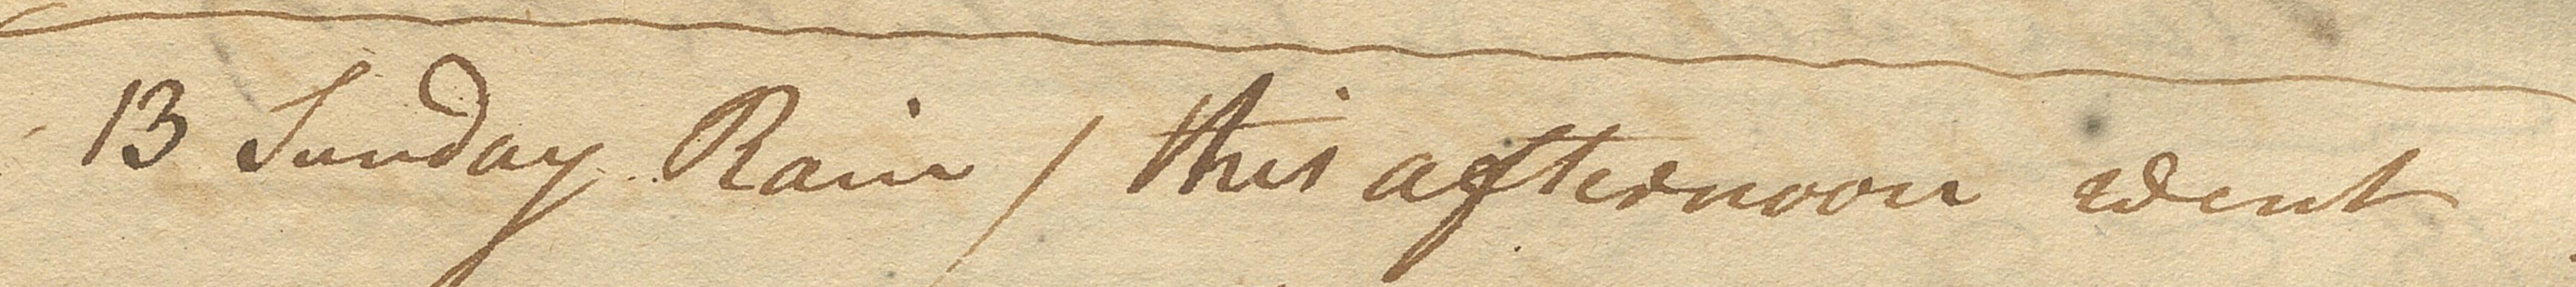13 Sunday Rain / this afternoon went
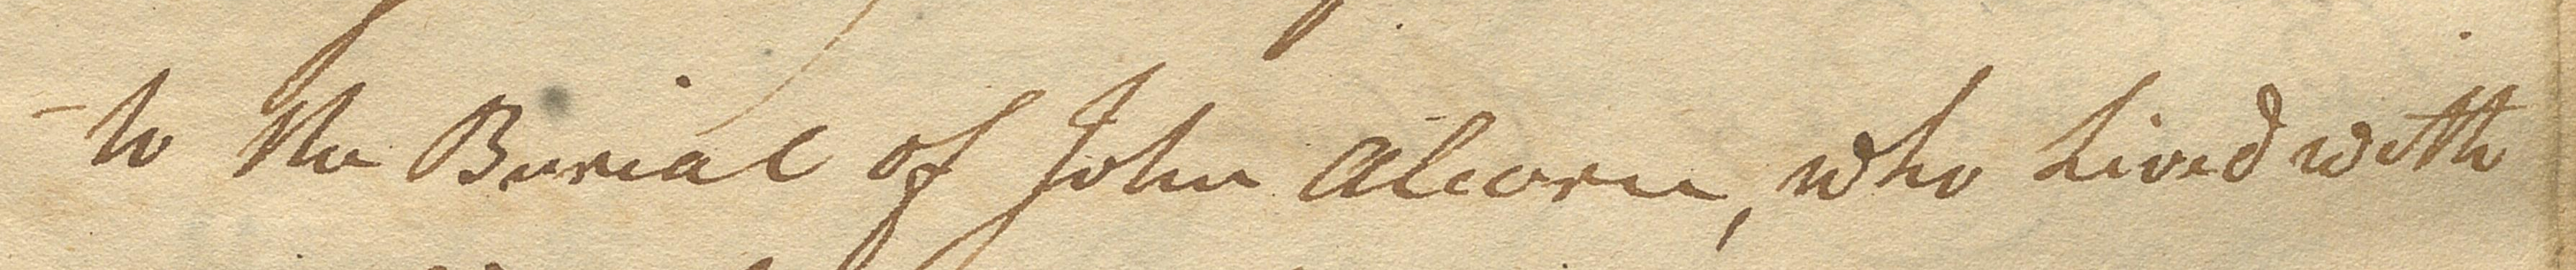to the Burial of John Alcorn, who Lived with
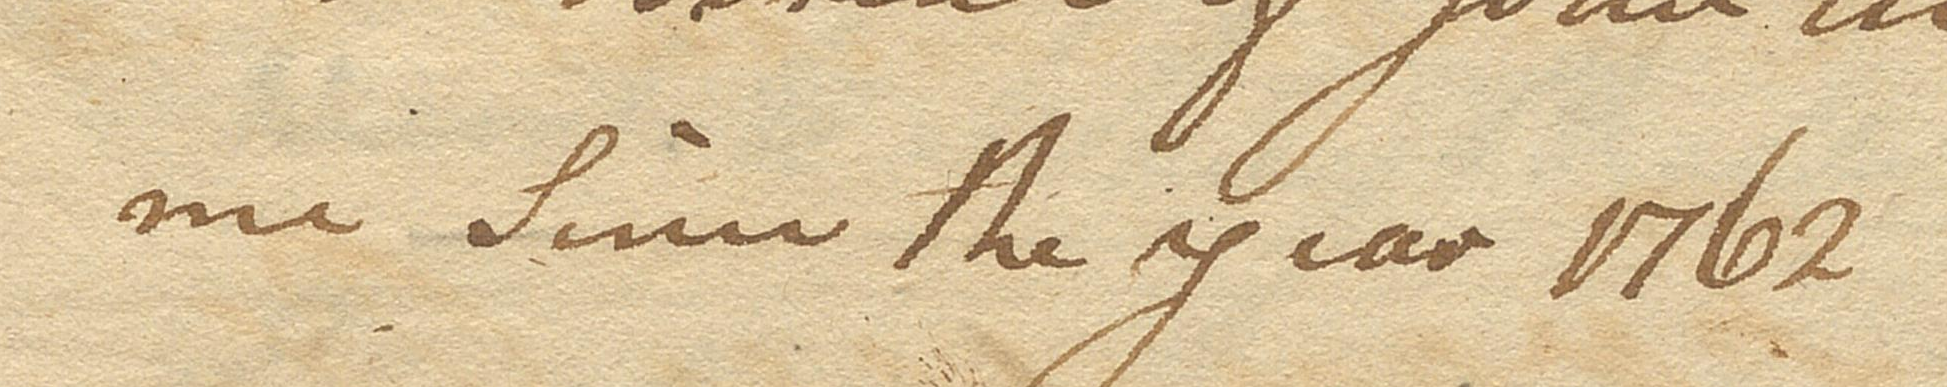me since the year 1762
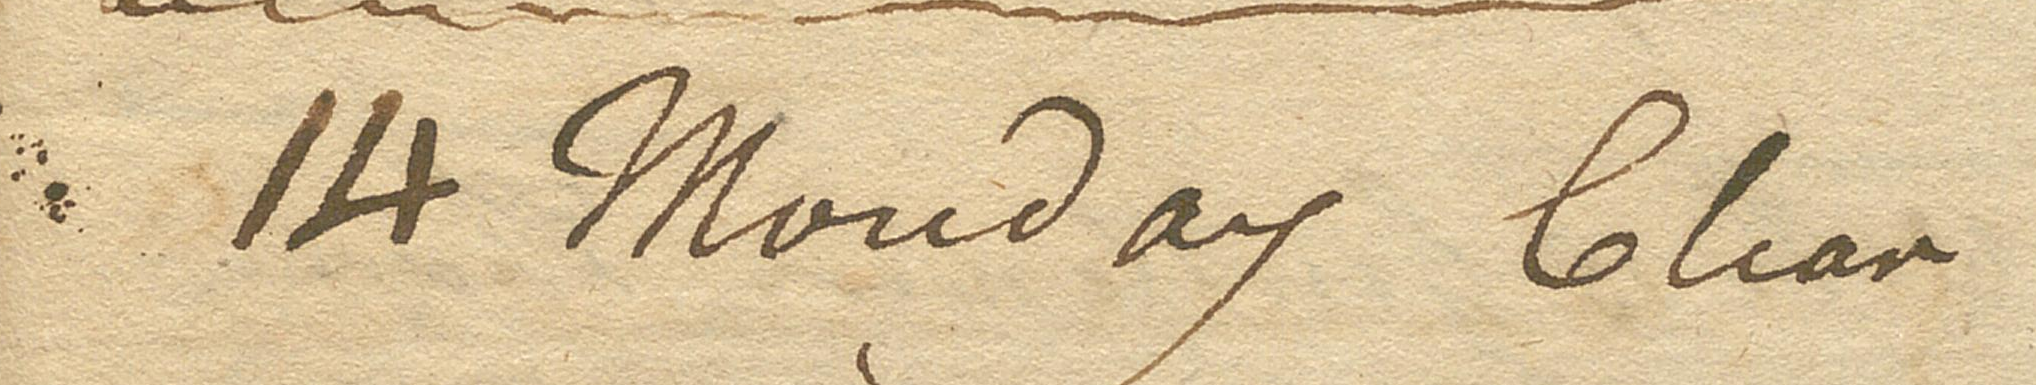14 Monday Clear
